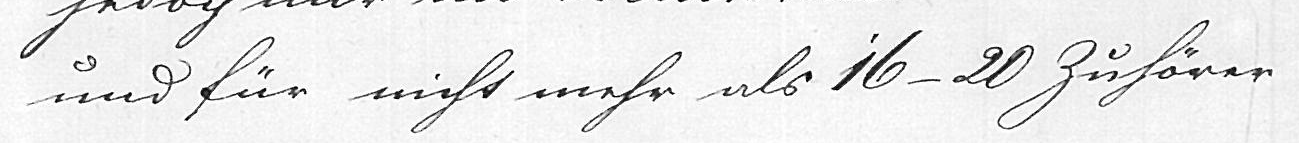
und für nicht mehr als 16-20 Zuhörer
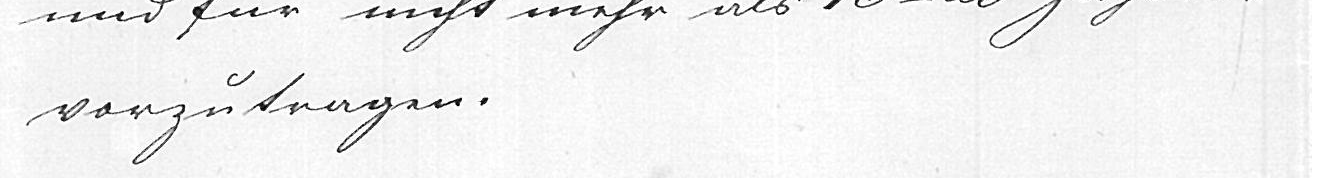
vorzutragen.
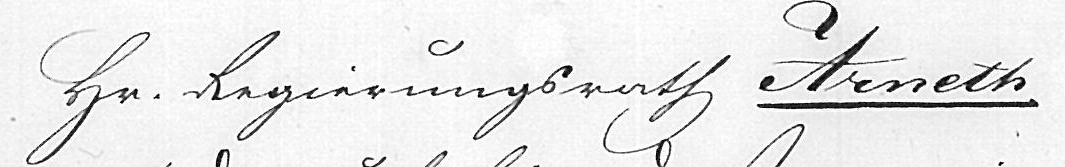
Hr. Regierungsrath Arneth
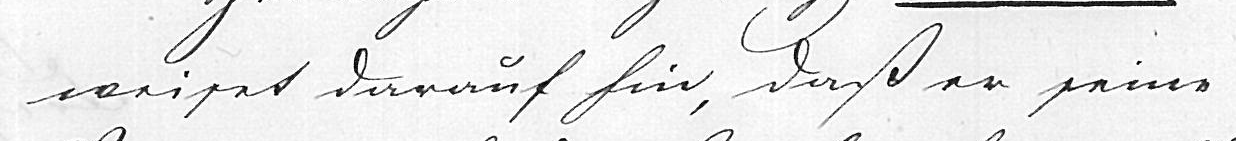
weiset darauf hin daß er seine
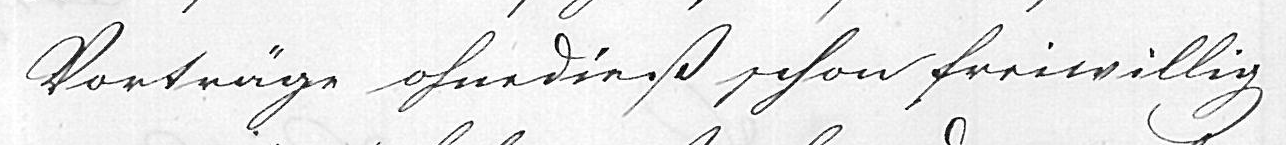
Vorträge ohnedieß schon freiwillig
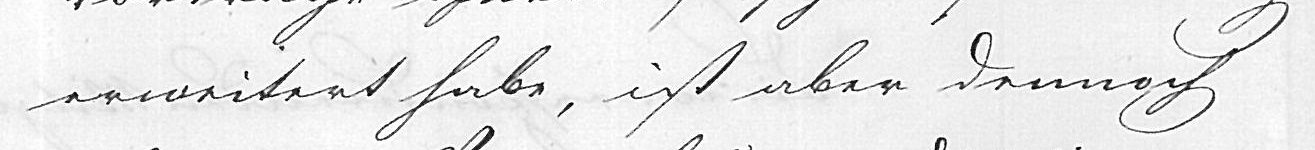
erweitert habe, ist aber dennoch
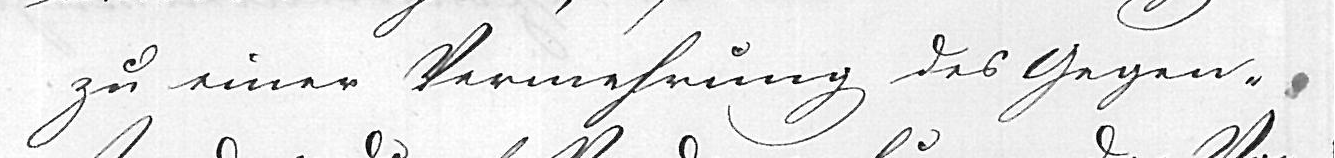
zu einer Vermehrung des Gegen-
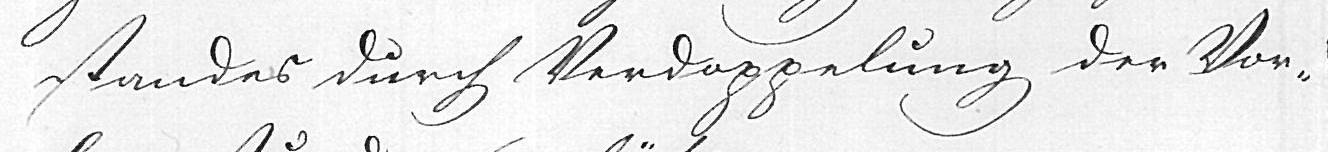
standes durch Verdoppelung, der Vor-
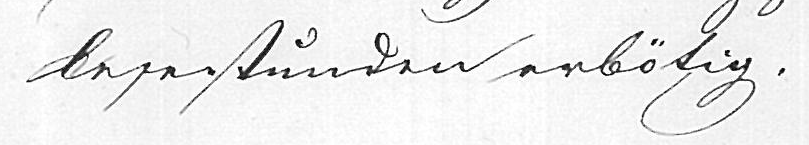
lesestunden erbötig.
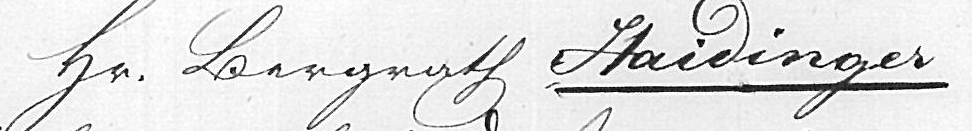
Hr. Bergrath Haidinger
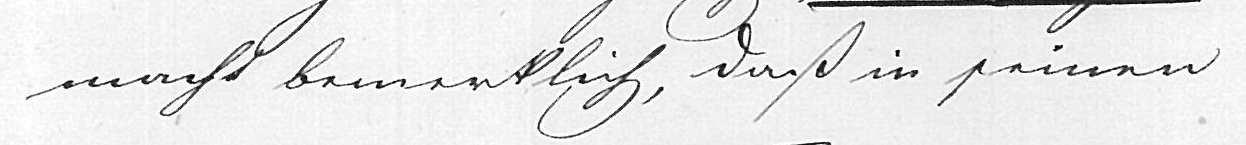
macht bemerklich, daß in seinen
